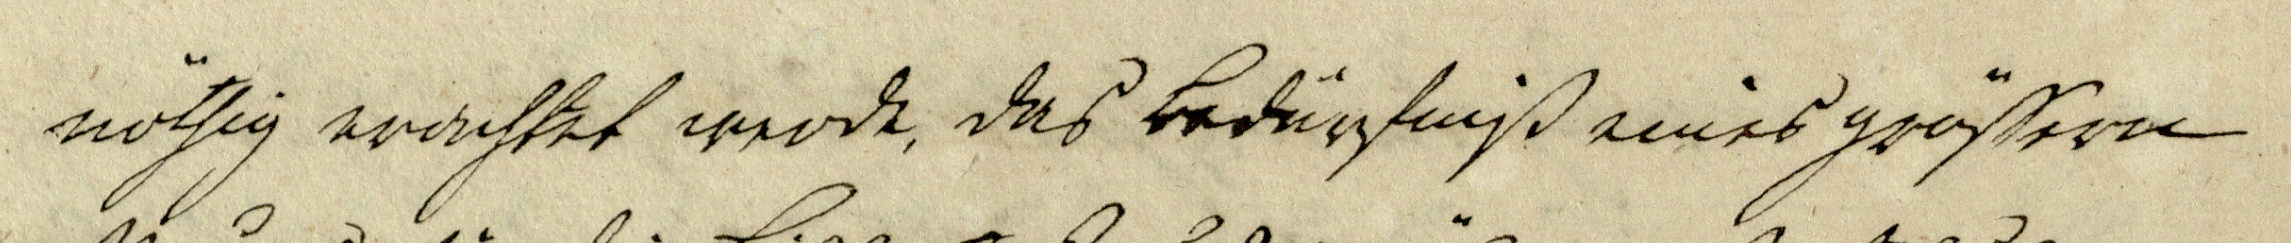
nöthig erachtet werde, das Bedürfniß eines grössern
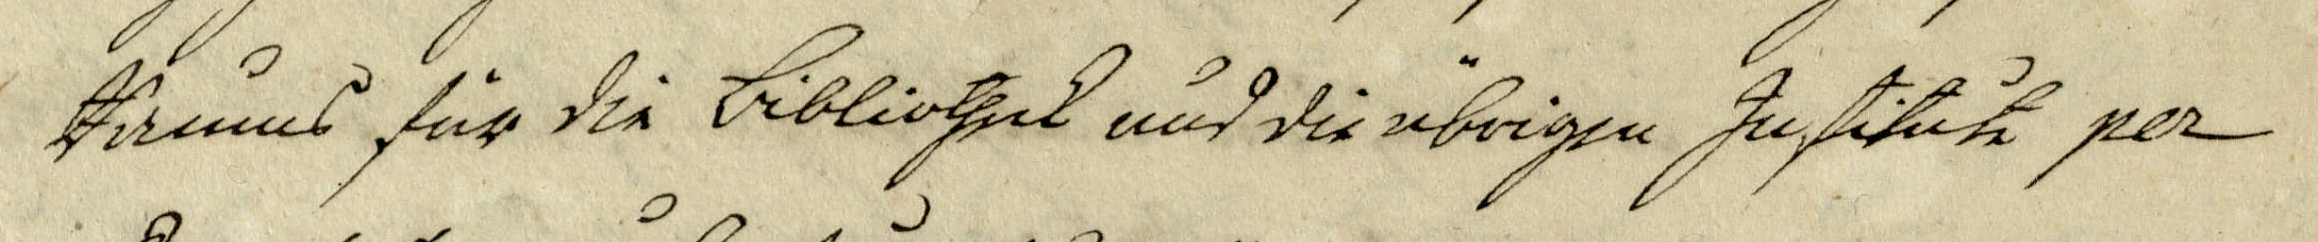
Raums für die Bibliothek und die übrigen Institute per
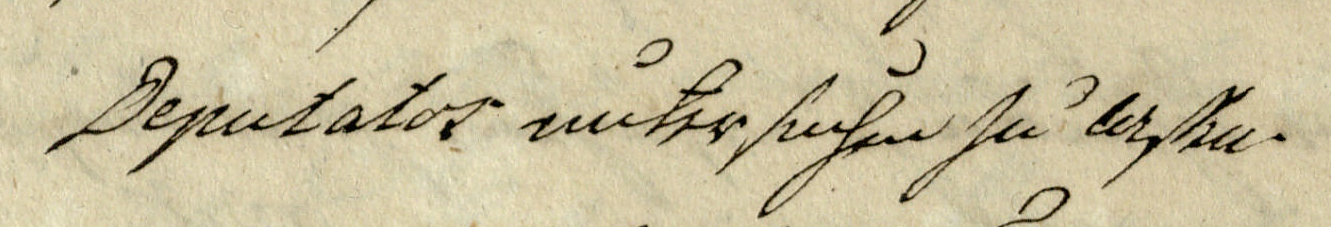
Deputatos untersuchen zu lassen.
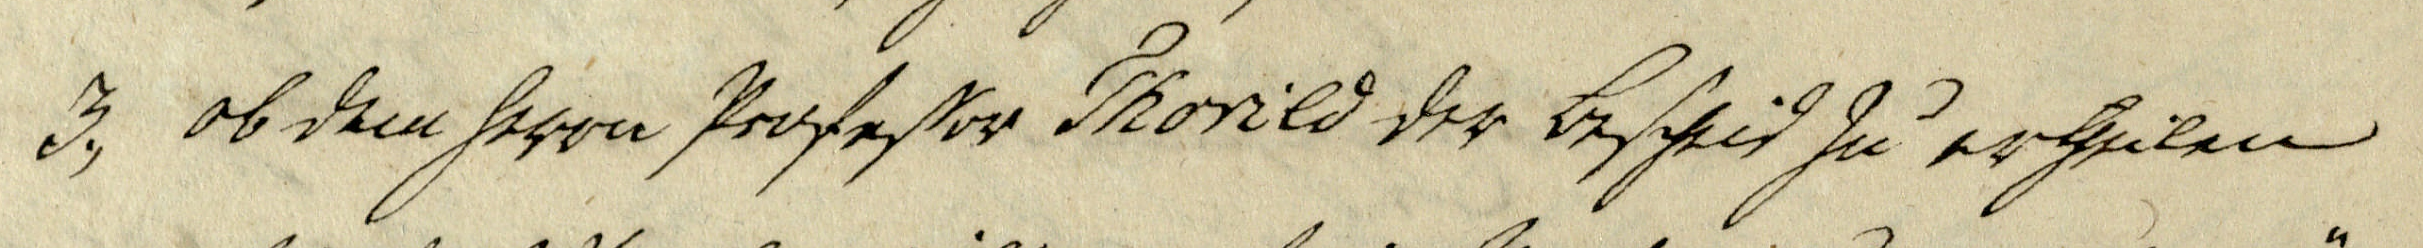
3., ob dem Herrn Professor Thorild der Bescheid zu ertheilen
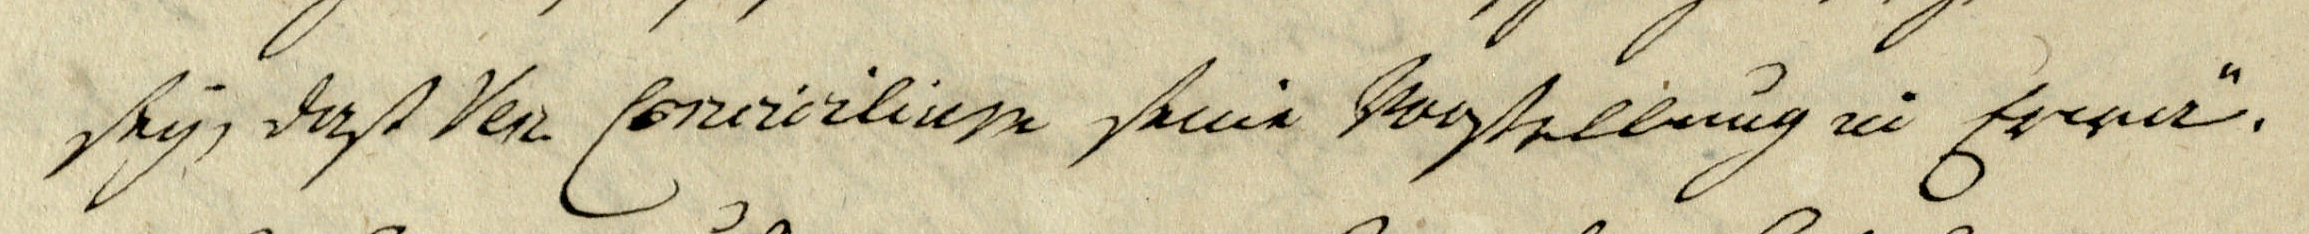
seÿ, daß Ven. Concilium seine Vorstellung in Erwä¬
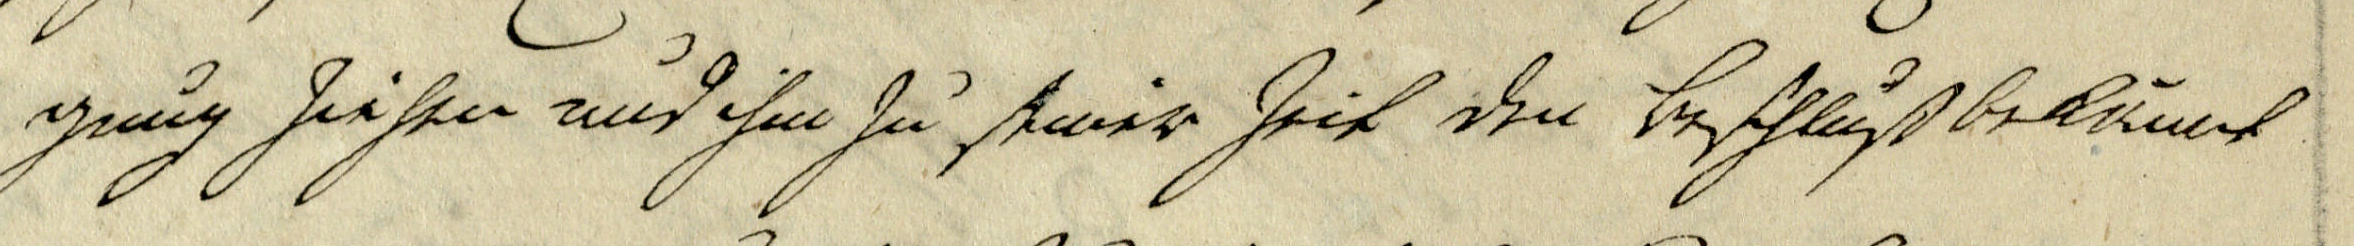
gung ziehen und ihm zu seiner Zeit den Beschluß bekannt
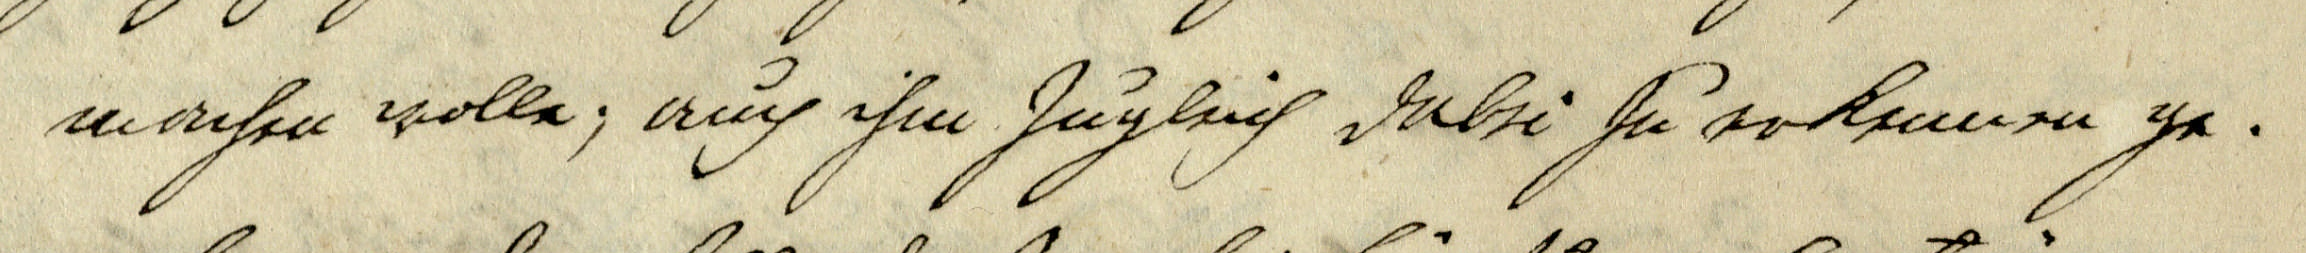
machen wolle; auch ihm zugleich dabei zu erkennen ge¬
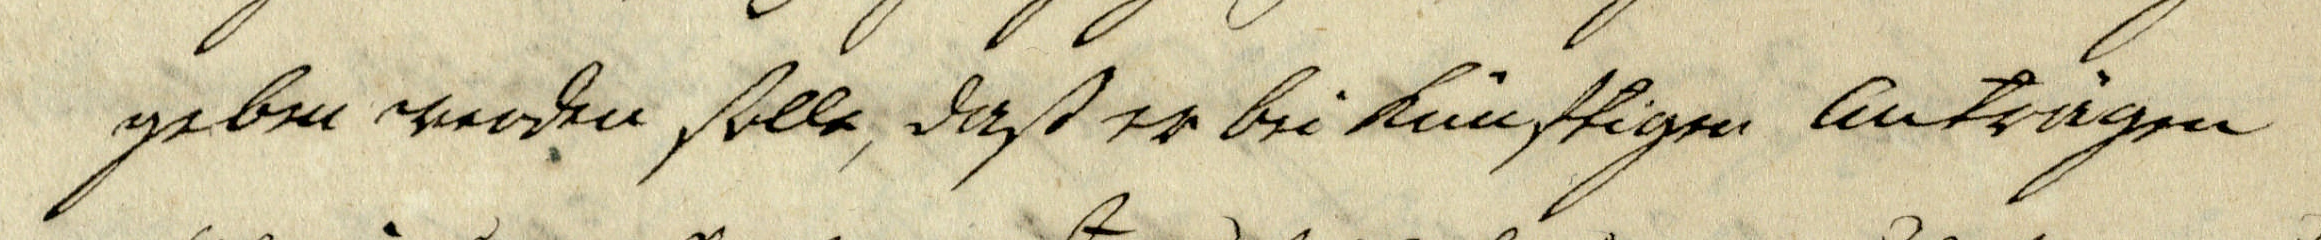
geben werden solle, daß er bei künftigen Anträgen
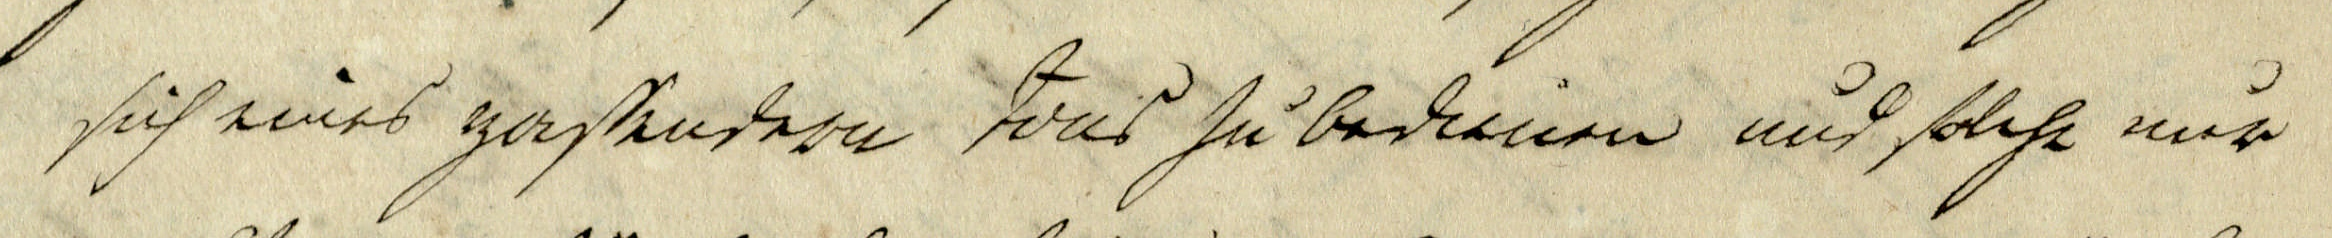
sich eines passenden Tons zu bedienen und solche nur
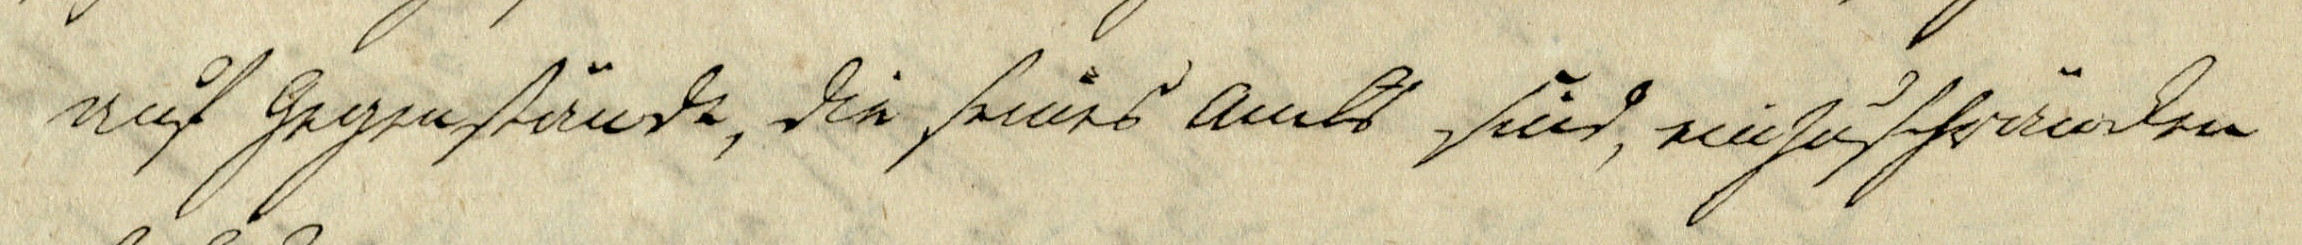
auf Gegenstände, die seines Amts sind, einzuschränken
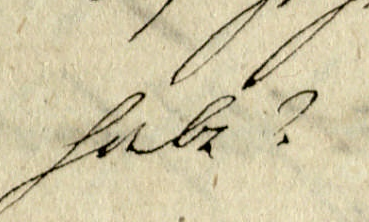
habe?
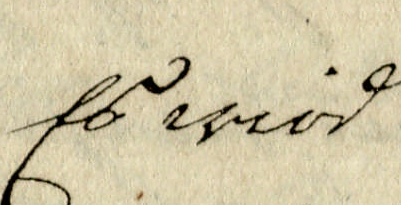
Es wird
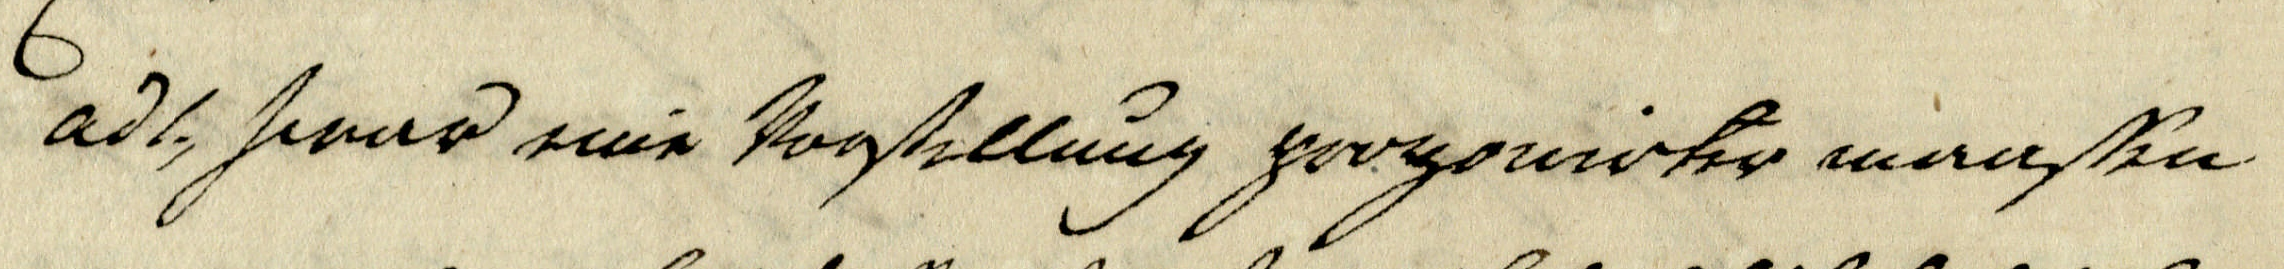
ad 1., zwar eine Vorstellung proponirter maassen
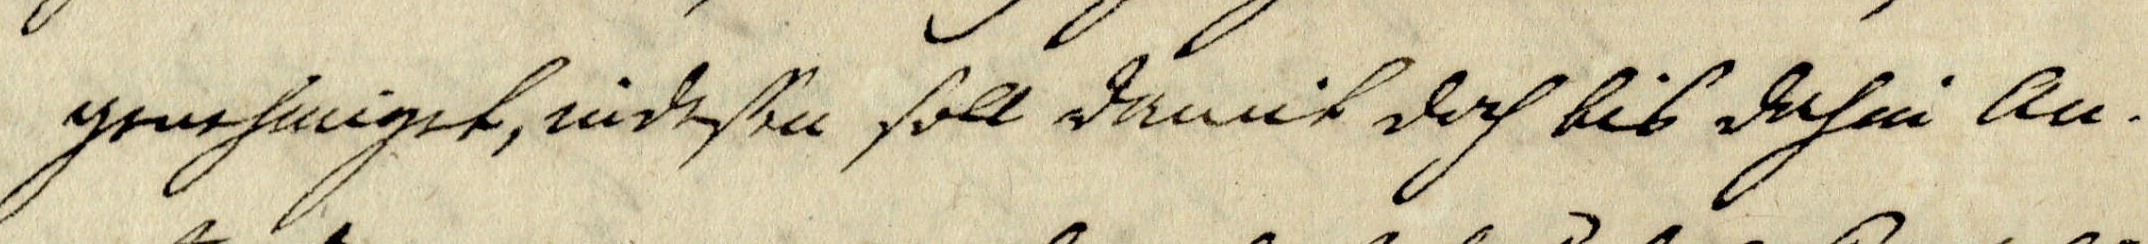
genehmiget, indessen soll damit doch bis dahin An¬
